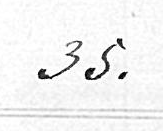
35.
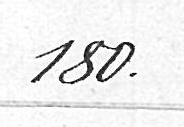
180.
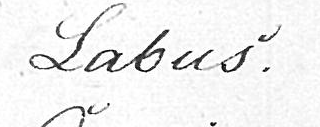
Labus
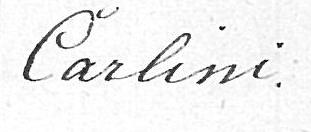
Carlini
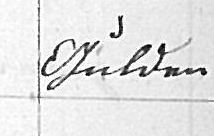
Gulden
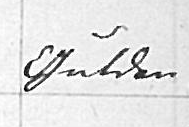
Gulden
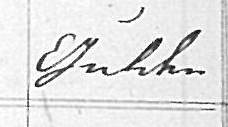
Gulden
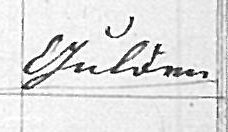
Gulden
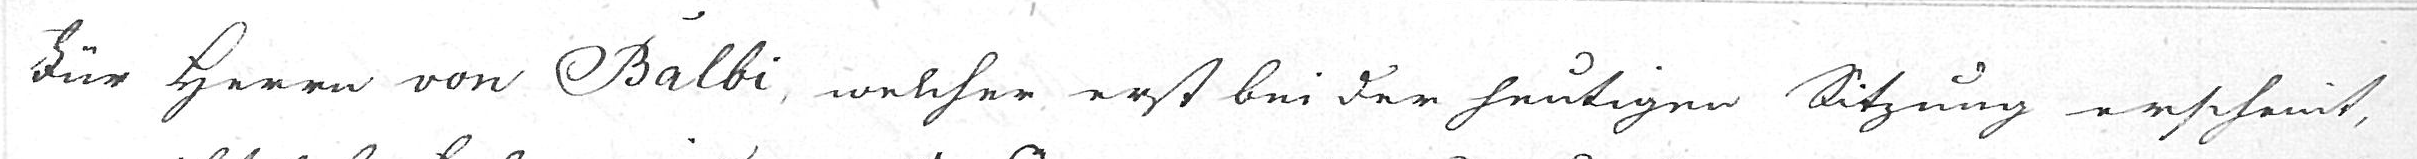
Für Herrn von Balbi, welcher erst bei der heutigen Sitzung erscheint,
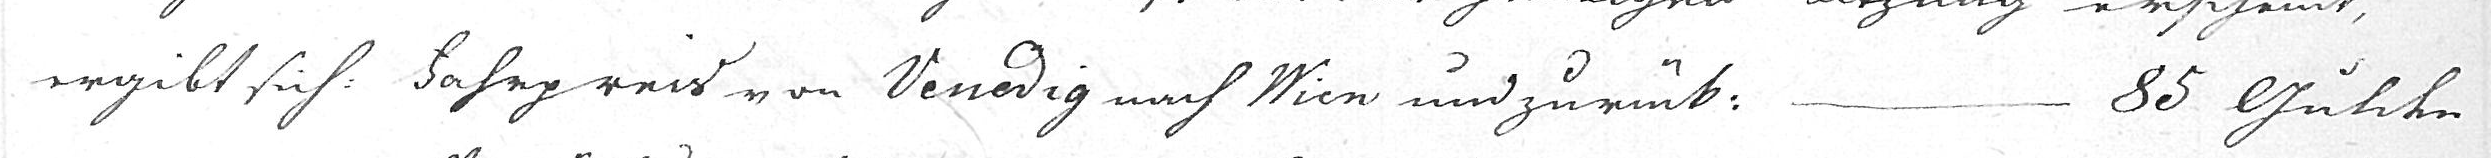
ergibt sich: Fahrpreis von Venedig nach Wien und zurück: -------- 85 Gulden
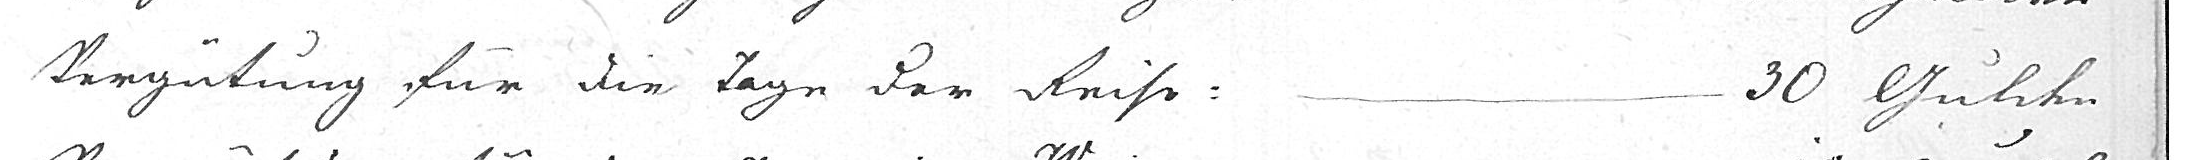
Vergütung für die Tage der Reise: --------------- 30 Gulden
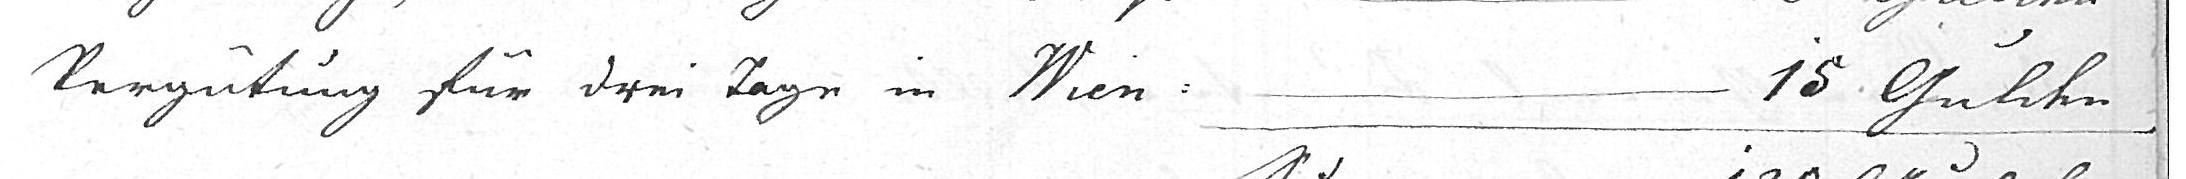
Vergütung für drei Tage in Wien: ----------------- 15 Gulden
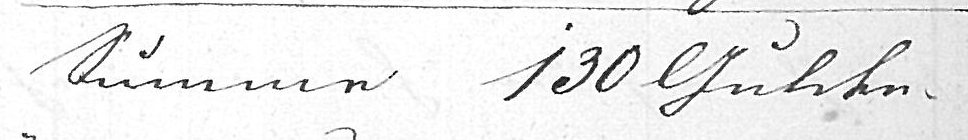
Summe 130 Gulden
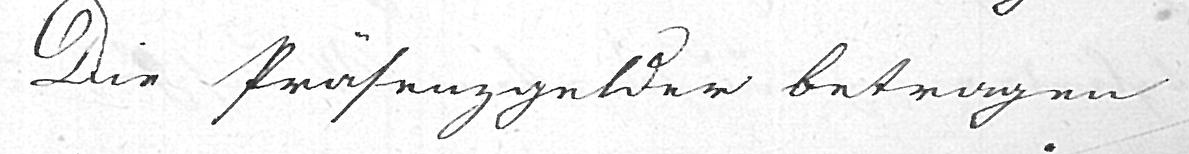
Die Präsenzgelder betragen
